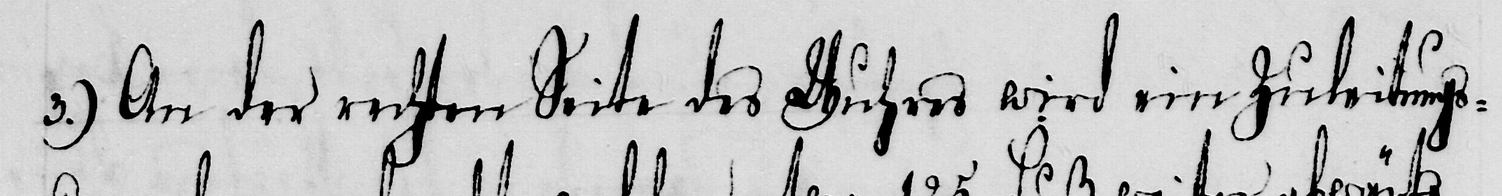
3.) An der rechten Seite des Wuhres wird ein Zuleitung¬
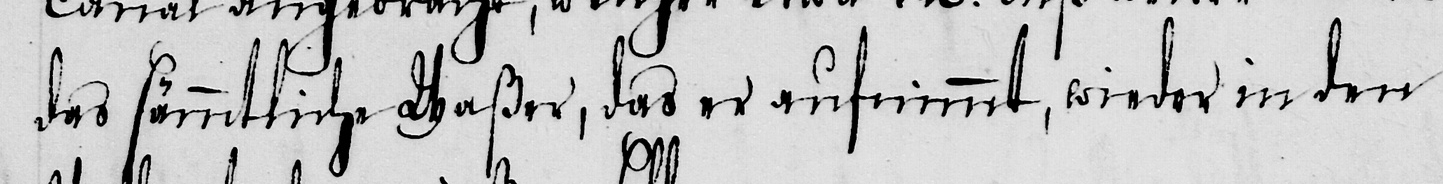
das sämmtliche Waßer, das er aufnimmt, wieder in den
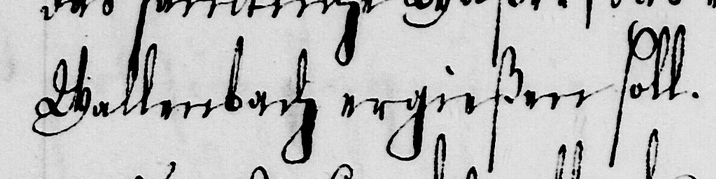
Wallenbach ergießen soll.
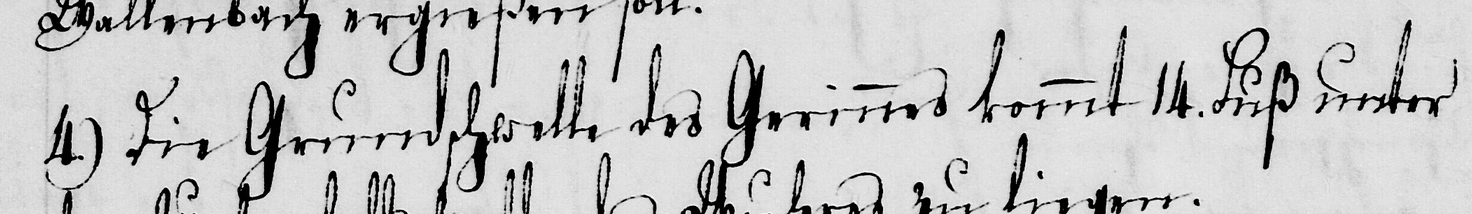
4.) Die Grundschwelle des Gerinnes kommt 14. Fuß unter
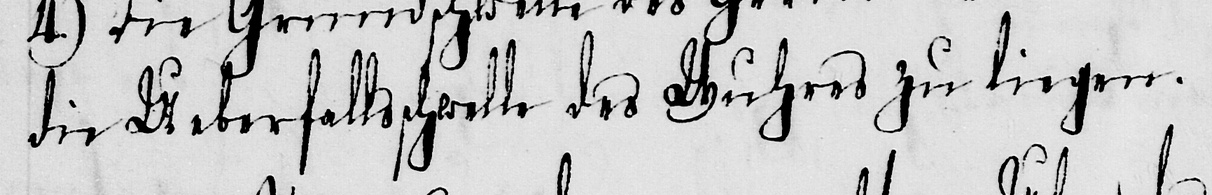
die Ueberfallsschwelle des Wuhres zu liegen.
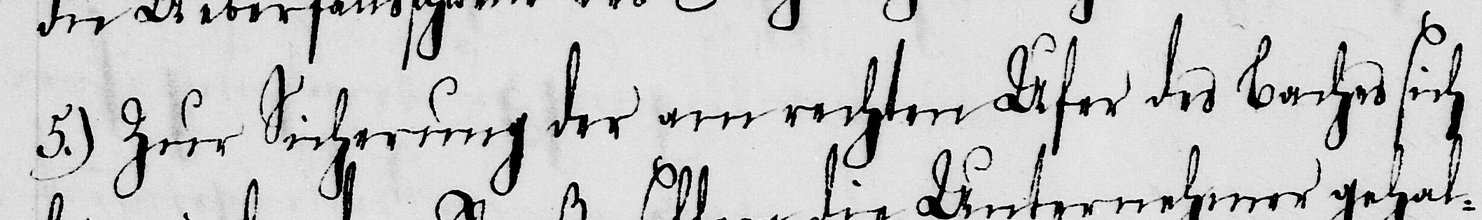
5.) Zur Sicherung der am rechten Ufer des Baches sich
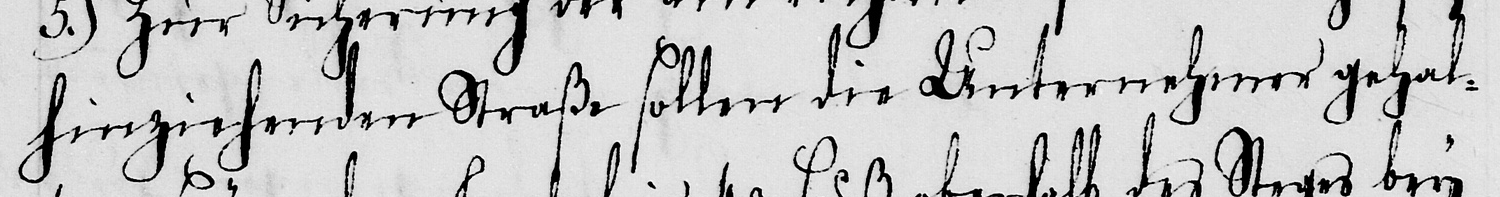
hinziehenden Straße sollen die Unternehmer gehal¬
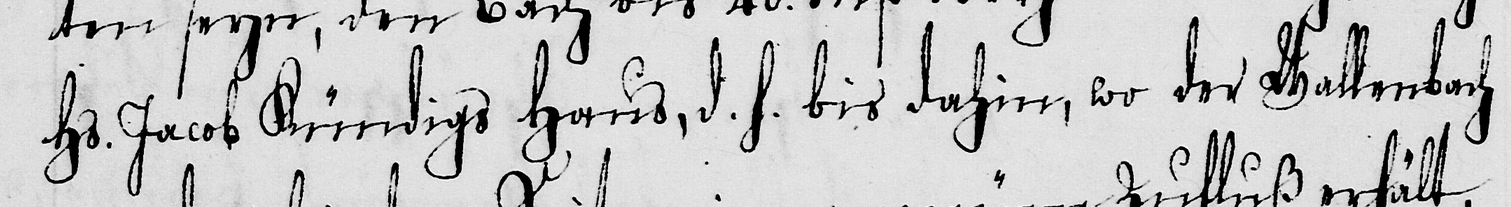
Hs. Jacob Kündigs Haus, d. h. bis dahin, wo der Wallenbach
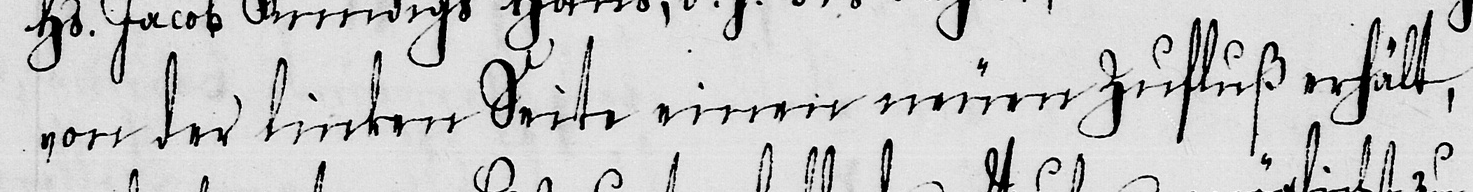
von der linken Seite einen neuen Zufluß erhält,
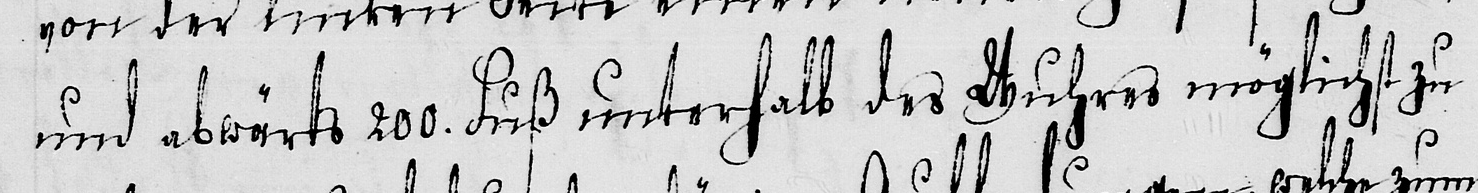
und abwärts 200. Fuß unterhalb des Wuhres möglichst zu
